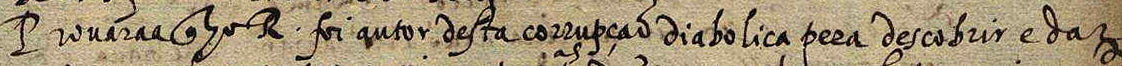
Prouaraa q̄ ho .R. foi autor desta corrupçaõ diabolica pera descobrir e dar
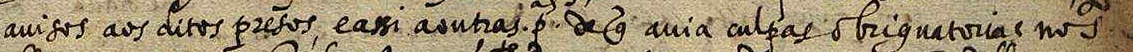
auisos aos ditos presos, e assi a outras. pas. de q̄ auia culpas obriguatorias no sto
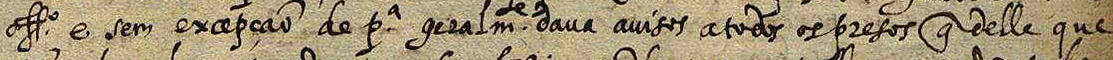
off.o e sem excepçaõ de p.a geralmte. daua auisos a todos os presos q̄ delle que
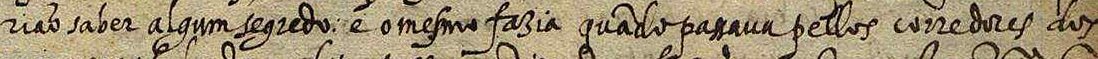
riaõ saber algum segredo: e o mesmo fazia quādo passaua pellos corredores dos
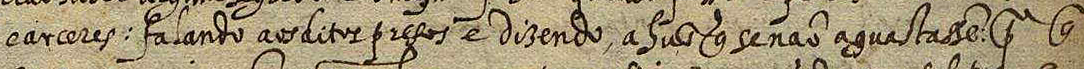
carceres: falando aos ditos presos e dizendo, a hus̄ q̄ se naõ aguastassē: p̄oq̄
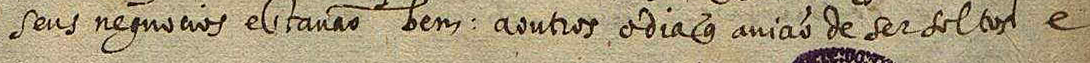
seus neguocios estauão bem: a outros o dia q̄ auiaõ de ser soltos e
